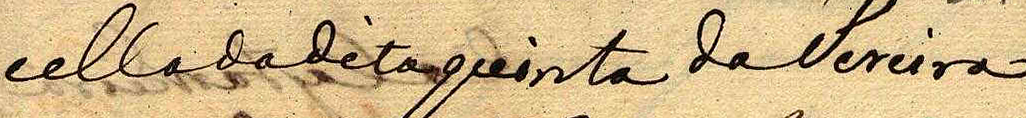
cella da dita quinta da Pereira
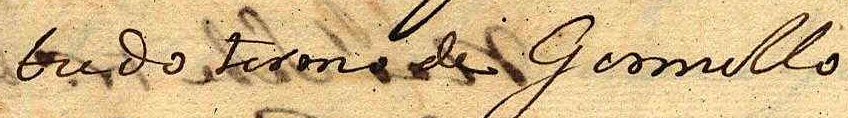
tudo termo de Germello
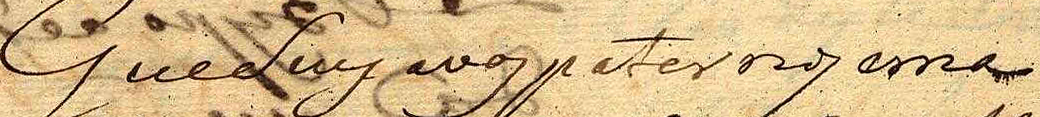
Que Seus avos paternos e ma
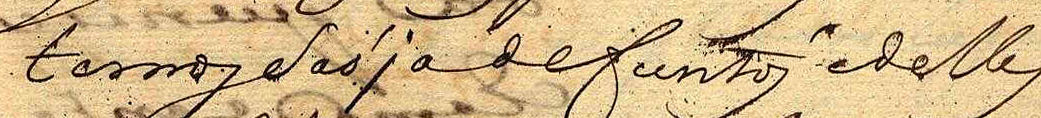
ternos Saõ ja defuntos e delles
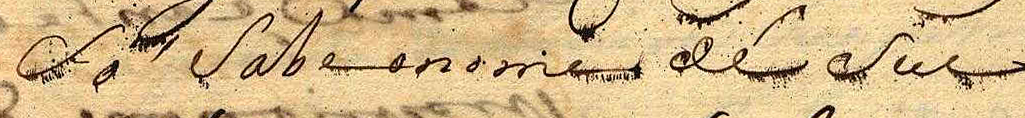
Só Sabe o nome de Seu
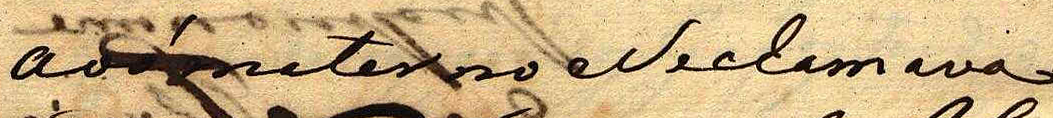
avo materno, e Se chamava
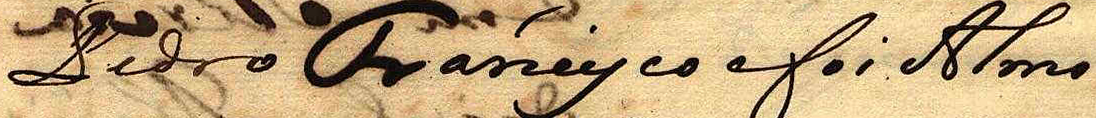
Pedro Francisco, e foi Almo
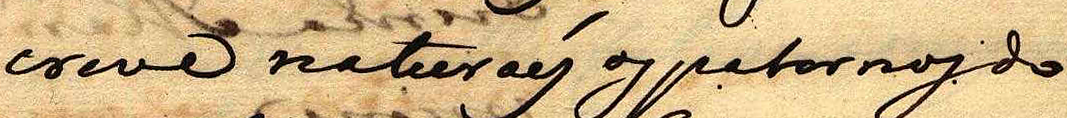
creve naturaes os paternos do
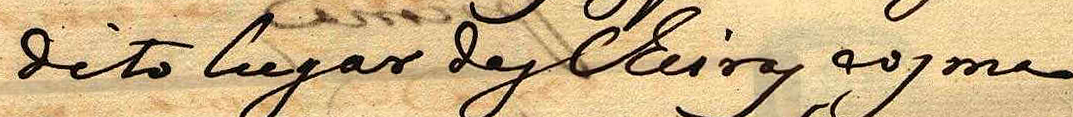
dito lugar das Cheiras, aos ma
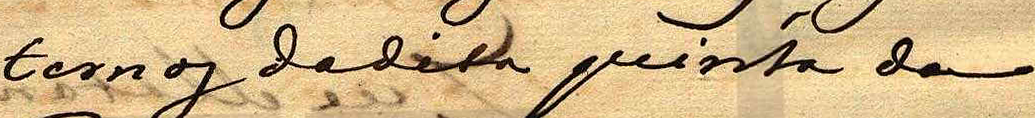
ternos da dita quinta da
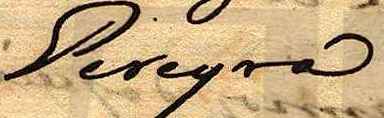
Pereyra
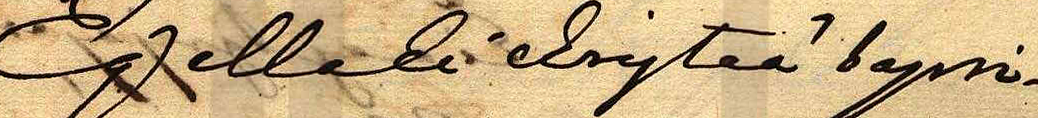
E q̄ ella hé christaã bapti
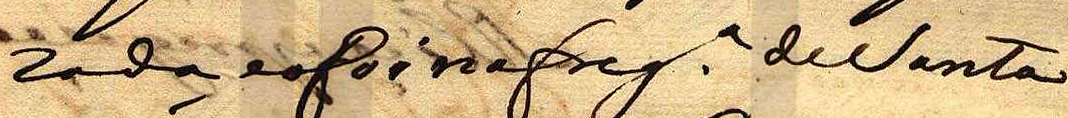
zada, e o foi na freg.a de Santa
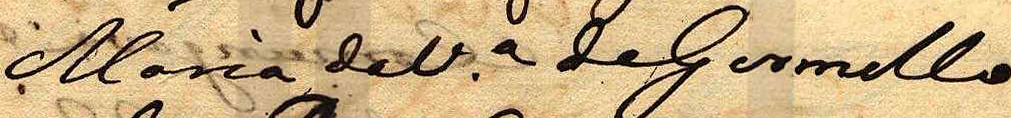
Maria da v.a de Germello
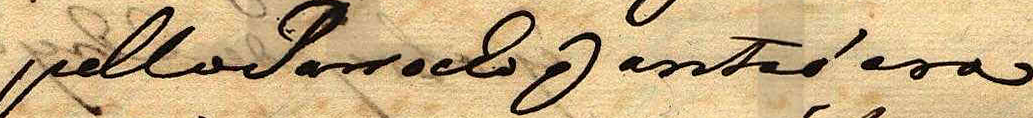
pello Parrocho q̄ antaõ era
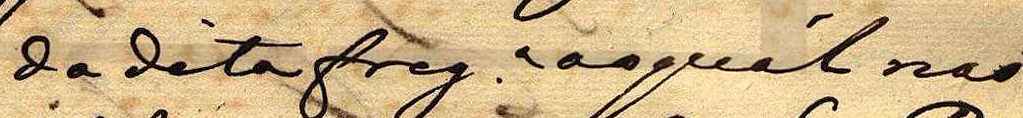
da dita freg.a ao qual naõ
